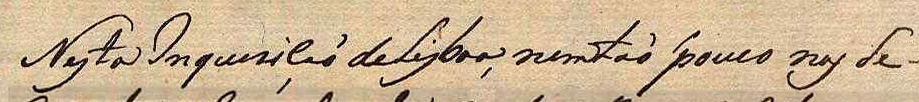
Nesta InquiziÇaõ de Lisboa, nem taõ pouco nas de
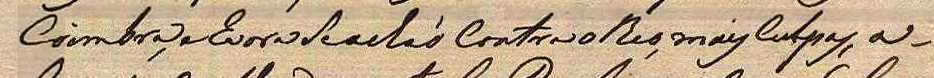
Coimbra, e Evora se achaõ Contra o Reo, mais Culpas, a
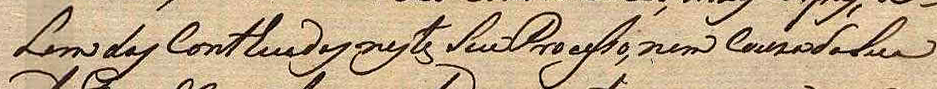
Lem das Contheudas neste Seu Processo, nem couza da Sua
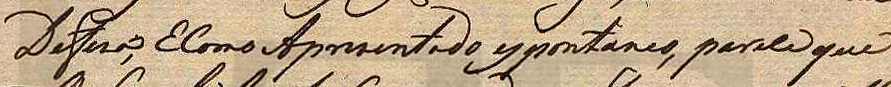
Defeza, E Como Aprezentado espontaneo, parece que
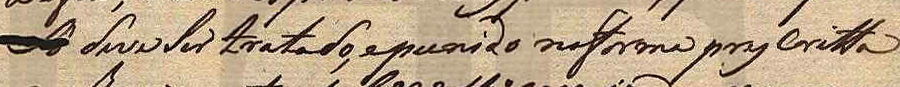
Só deve Ser tratado, e punido na forma prescritta
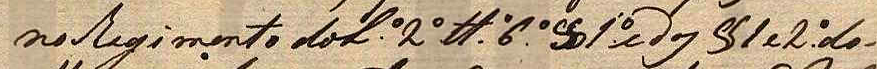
no Regimento do L.o 2o tt.o 6.o §1o e dos §1 e 2.o do
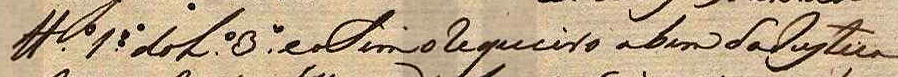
tt.o 1.o do L.o 3.o e aSim o Requeiro a bem da Iustiça
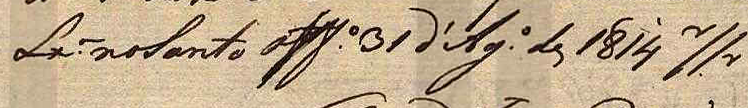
Lx.a no Santo off.o 31 d'Ag.o de 1814 r//r
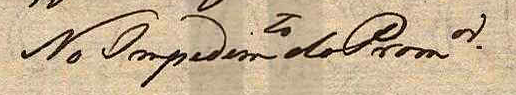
No Impedim.to do Promor.
